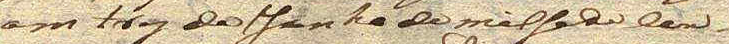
am tres de Junho de mil setecen
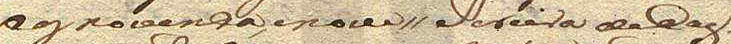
tos noventa, e nove// Pereira de Cas
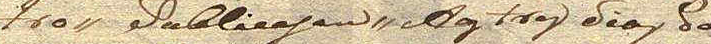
tro// Publicasam// Aos tres dias do
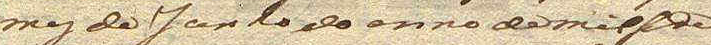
mes de Junho do anno de mil sete
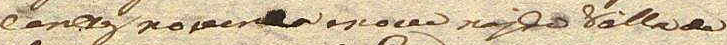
centos noventa e nove nesta Villa de
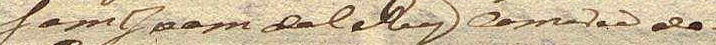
Sam Joam del Rey comarca do
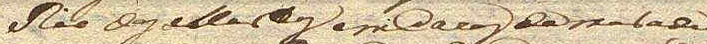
Rio as Mortes em cazas da morada
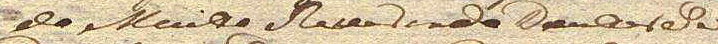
do Muito Reverendo Doutor Pa
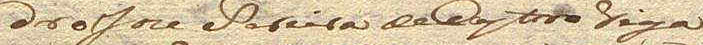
dro Joze Pereira de Castro Viga
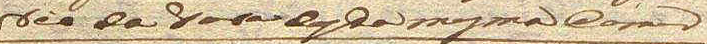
rio da Vara desta mesma Comar
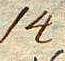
14
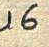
16
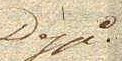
Desp.o
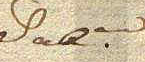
Pub.am
